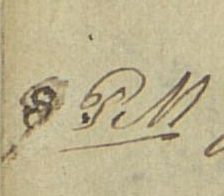8 PM
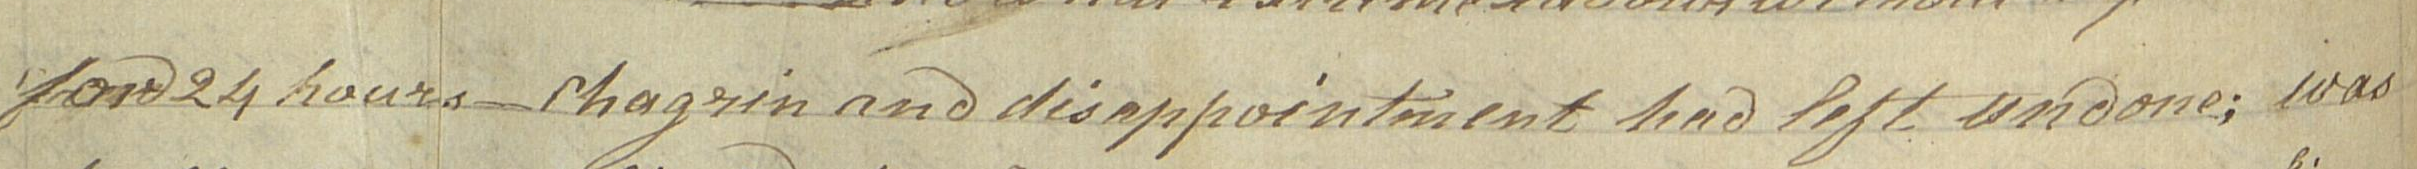for 24 hours. Chagrin and disappointment had left undone; was
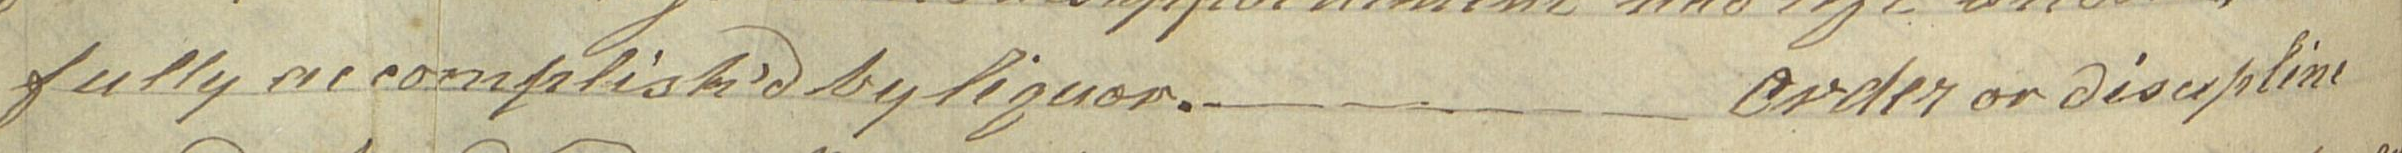fully accomplish'd by liquor. Order or discipline
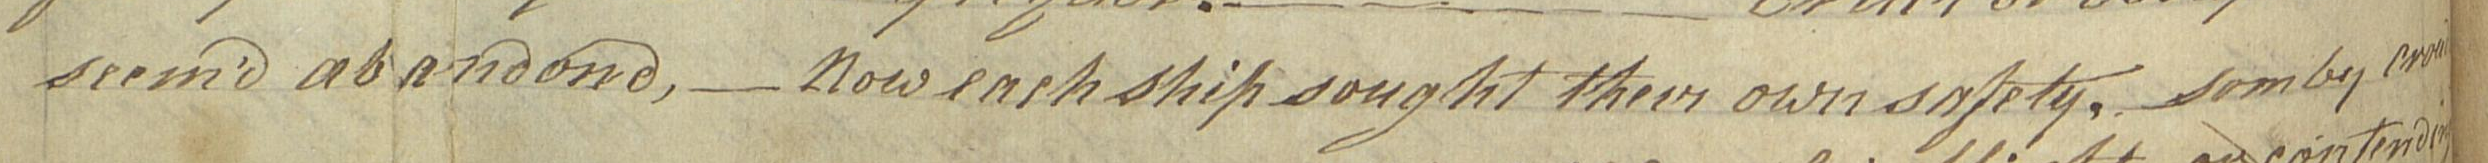seem'd abandond, Now each ship sought their own safety, som by croa-
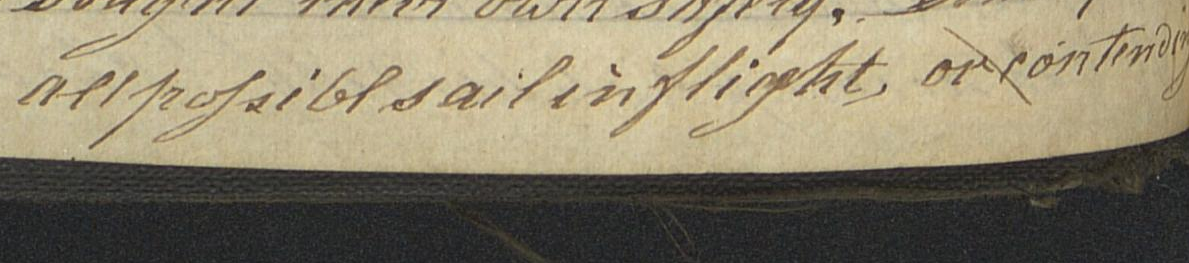all possibl sailing flight, or contending
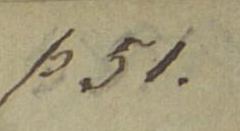p 51
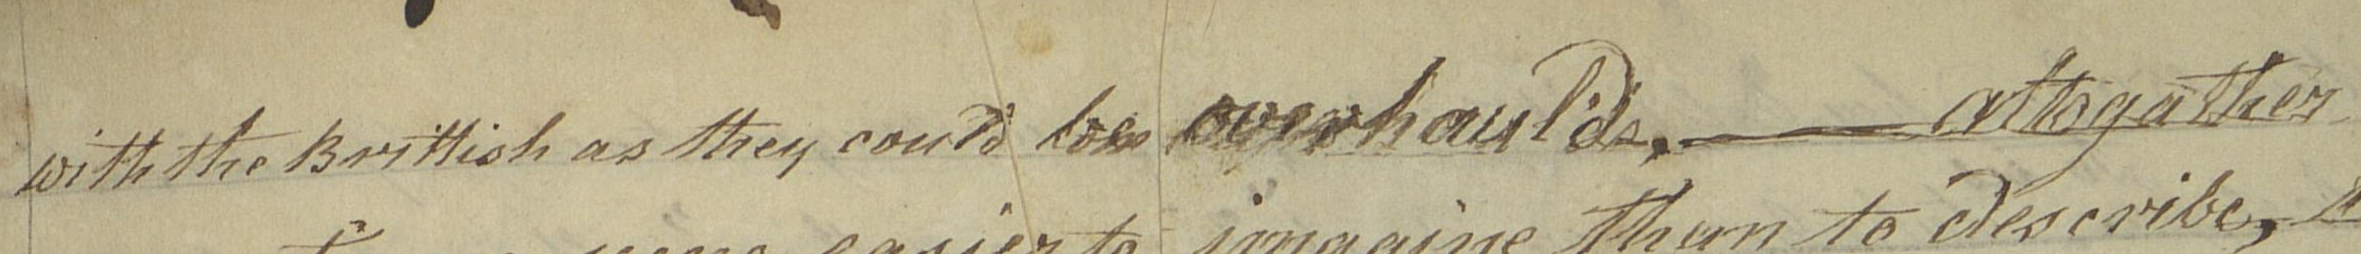with the British as they could be overhauld, altogether
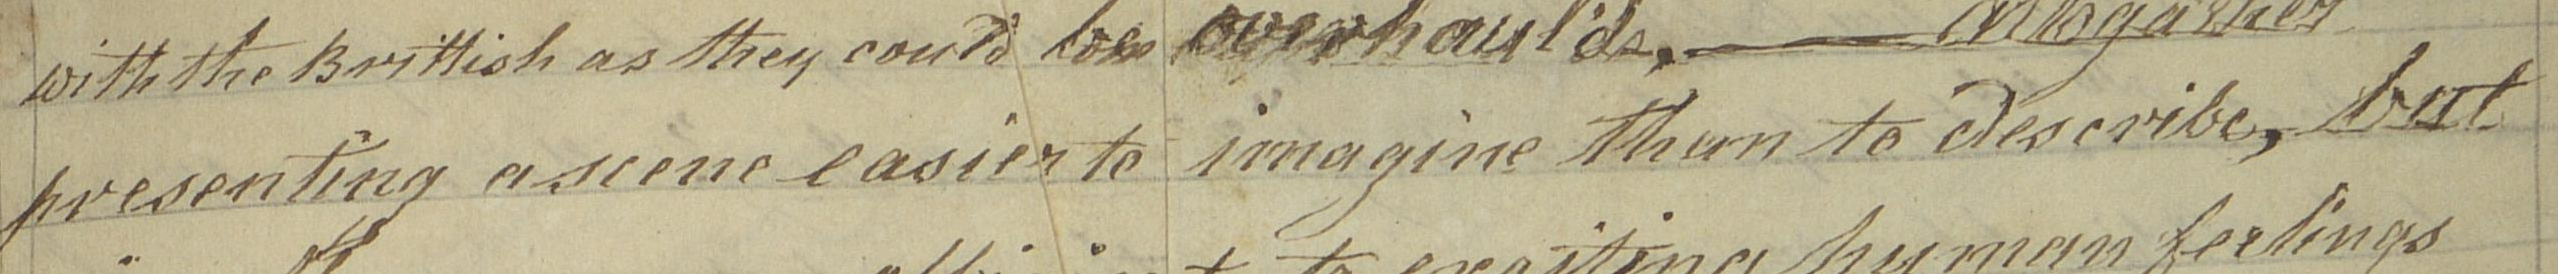presenting a scene easier to imagine them to describe, but
